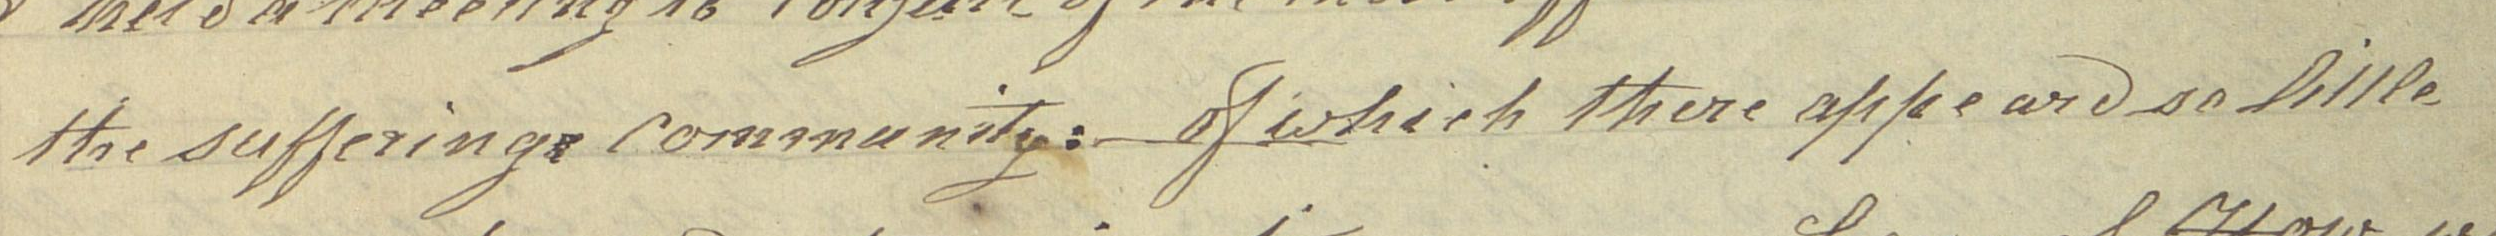the sufferings community: of which there appeard so little
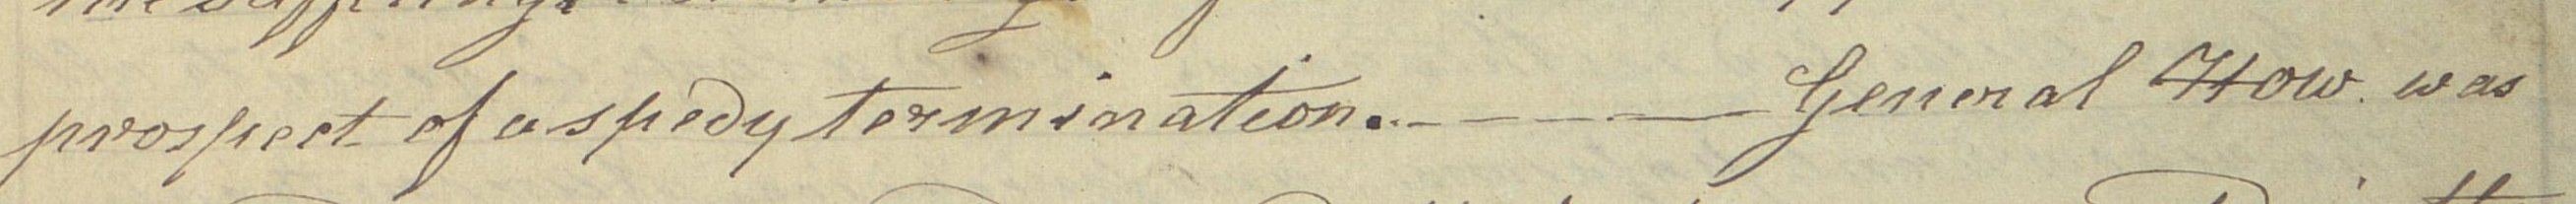prospect of a spedy termination. General How was
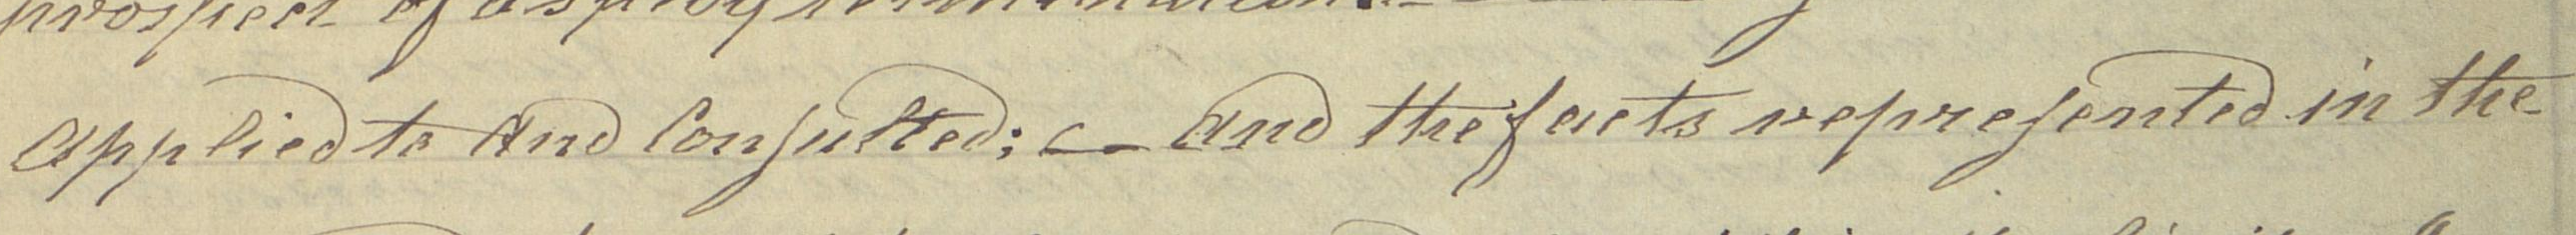applied to and Consulted: And the facts represented in the
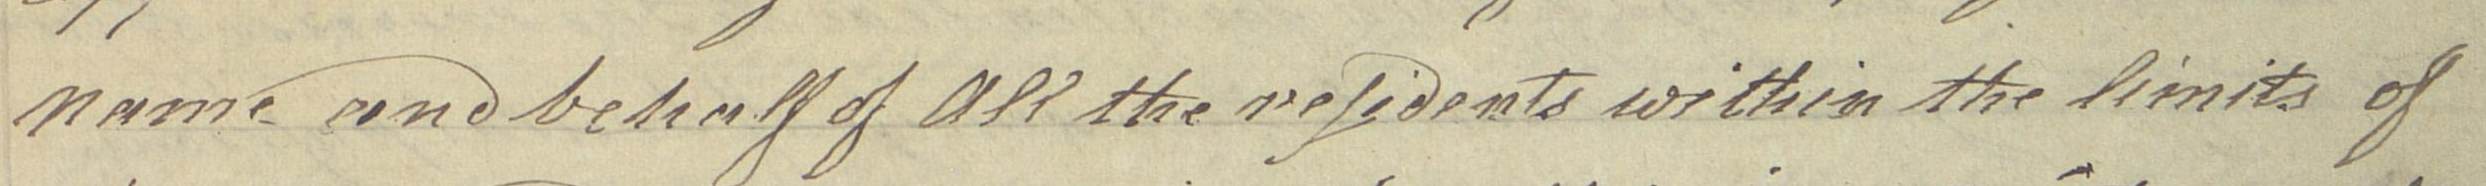name and behalf of All the residents within the limits of
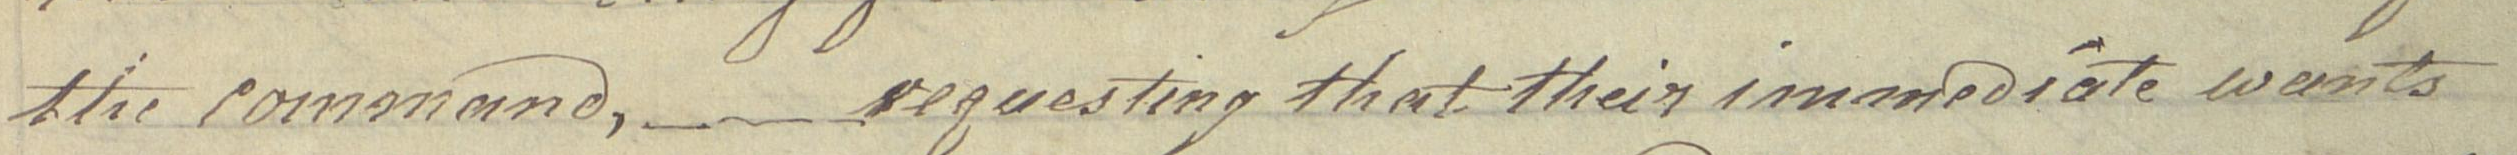the command, requesting that their immediate wants
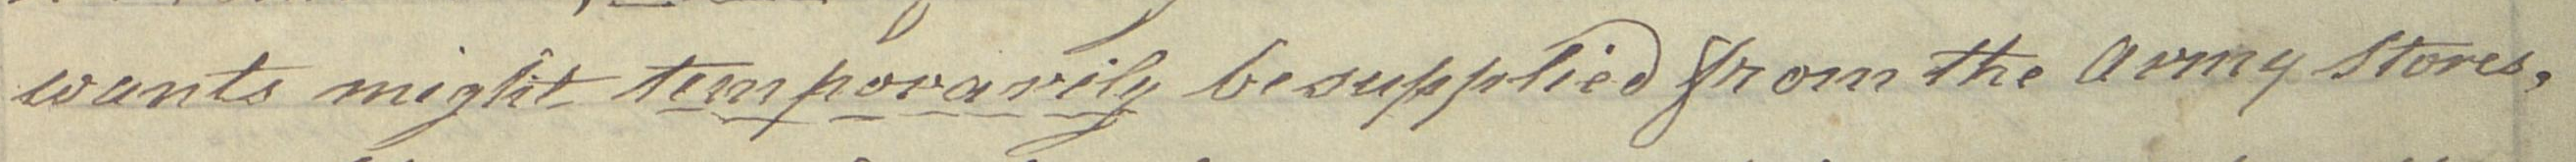wants might temporarily be supplied from the Army stores,
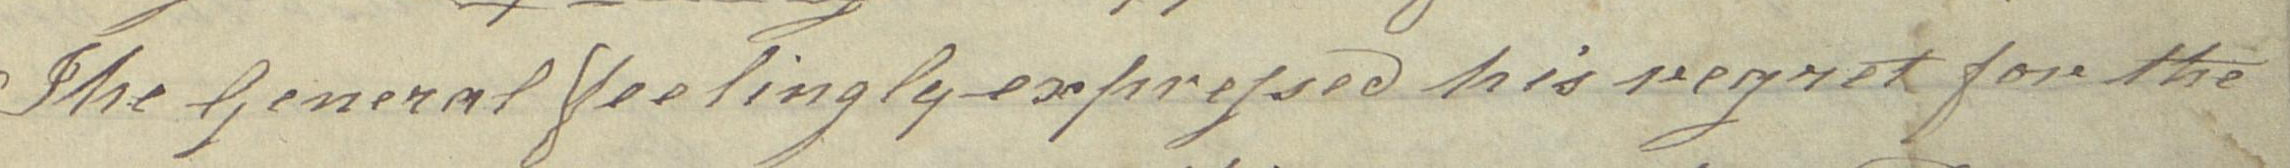The General feelingly expressed his regret for the
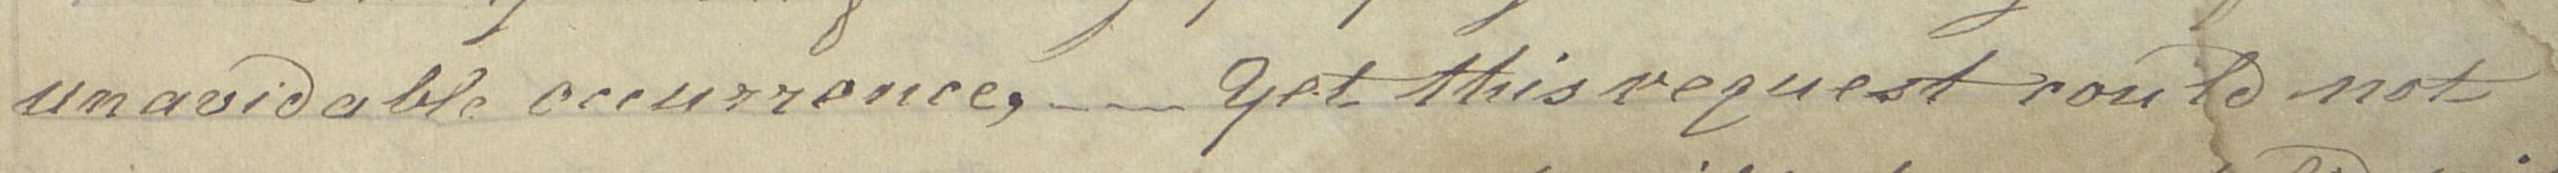unavoidable occurrence, Yet this request could not
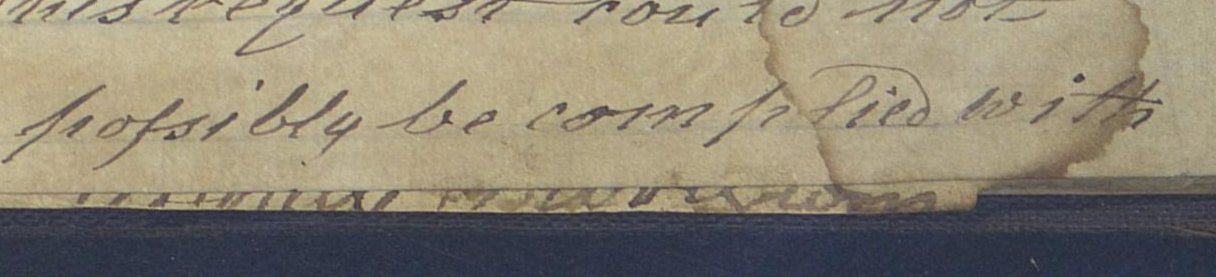possibly be complied with
